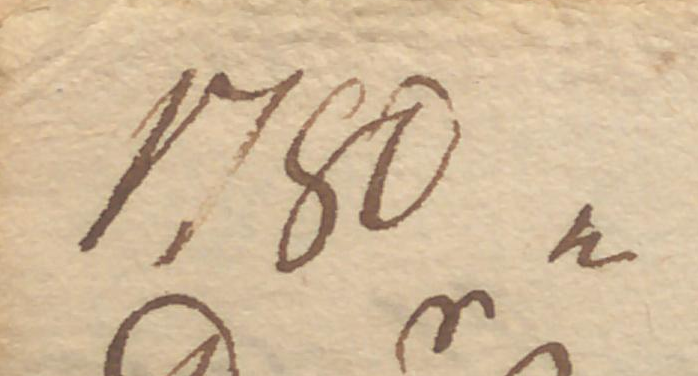1780
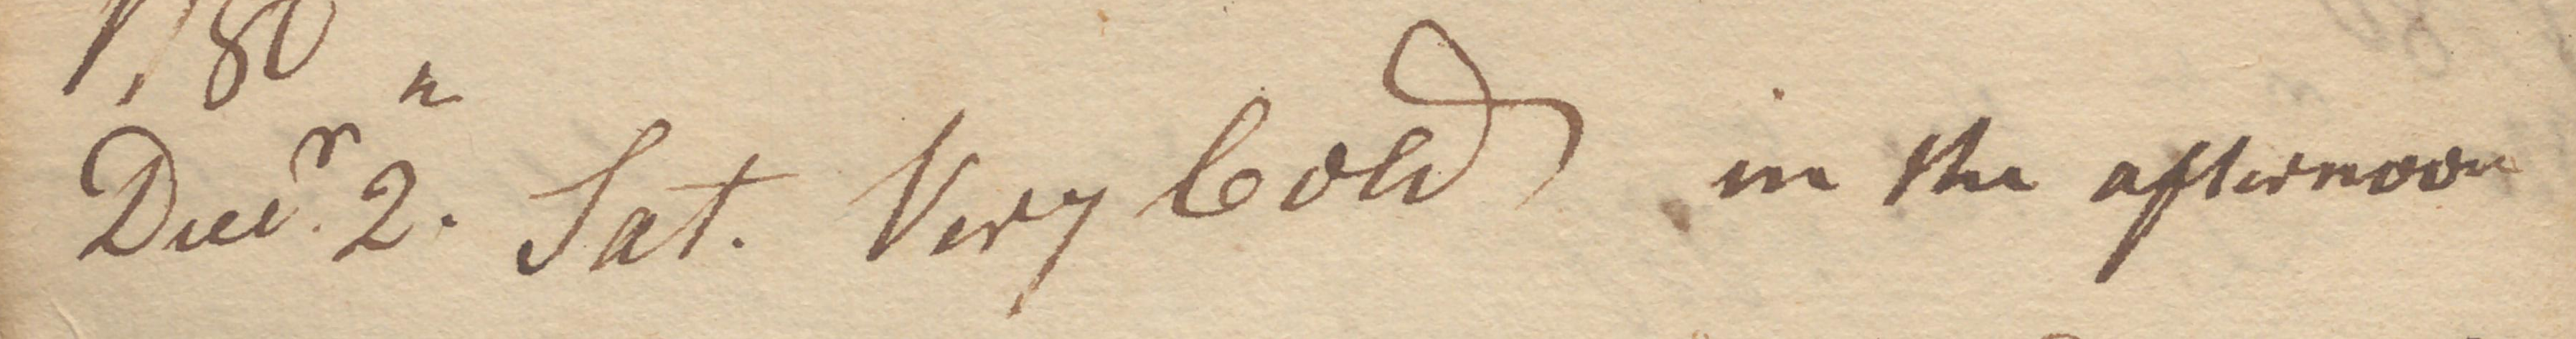Dec^r. 2^th. Sat. Very Cold in the afternoon
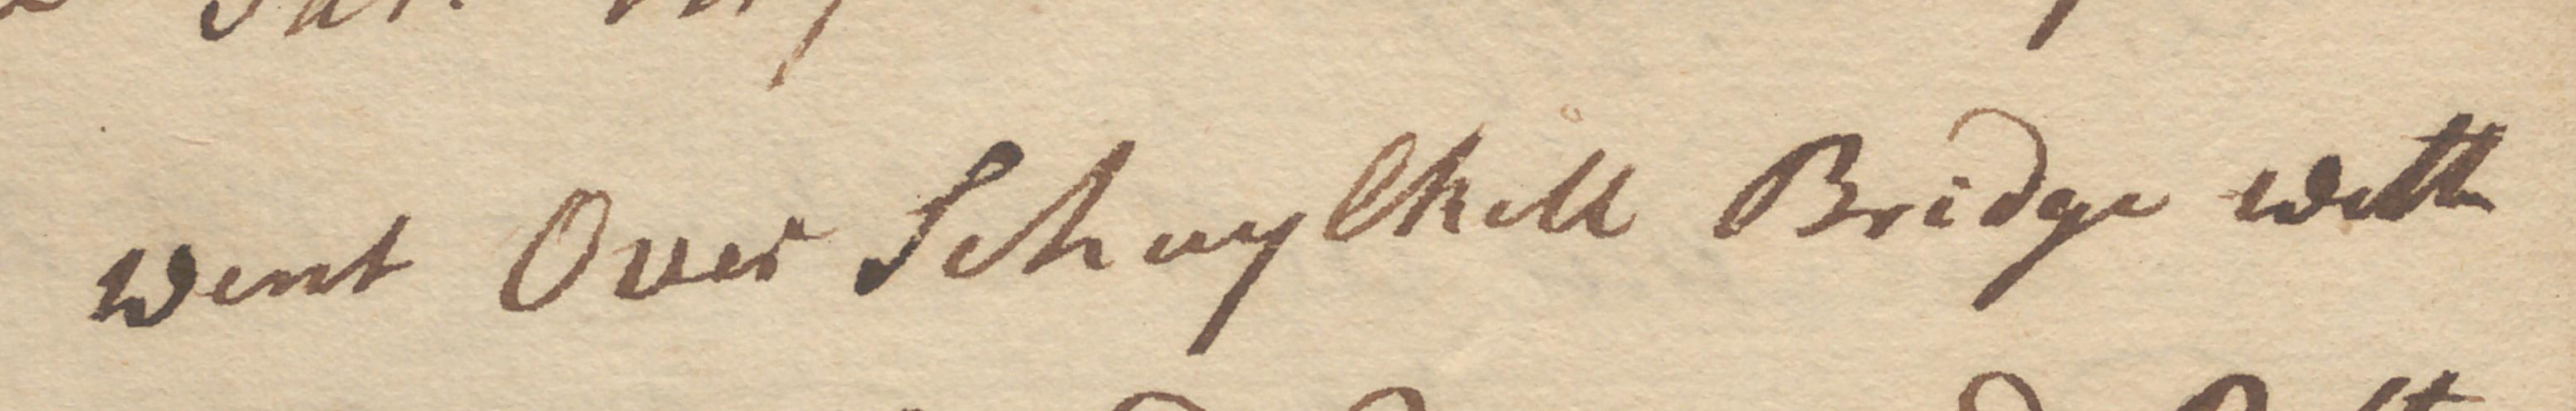went over Schuylkill Bridge with
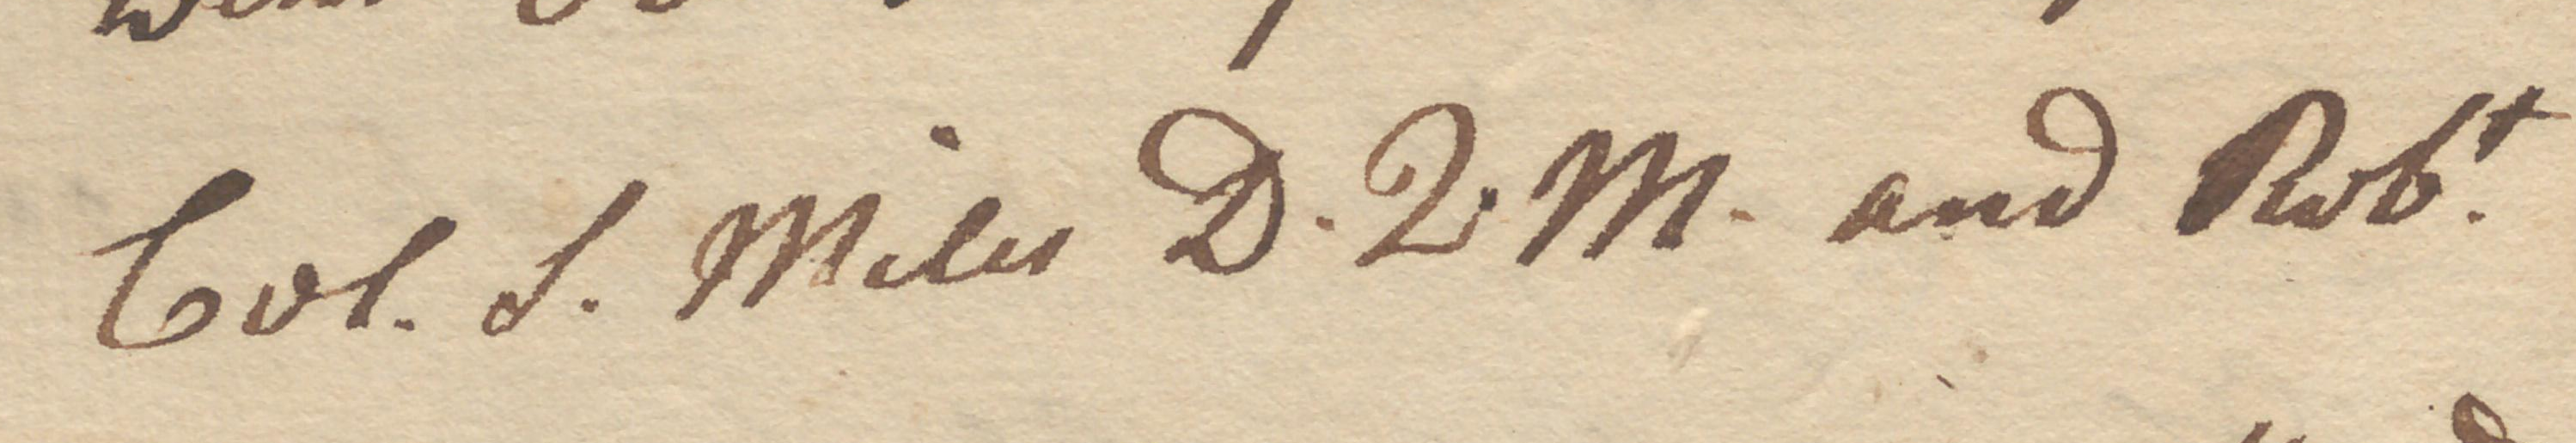Col. S. Miles D.Q.M. and Rob^t.
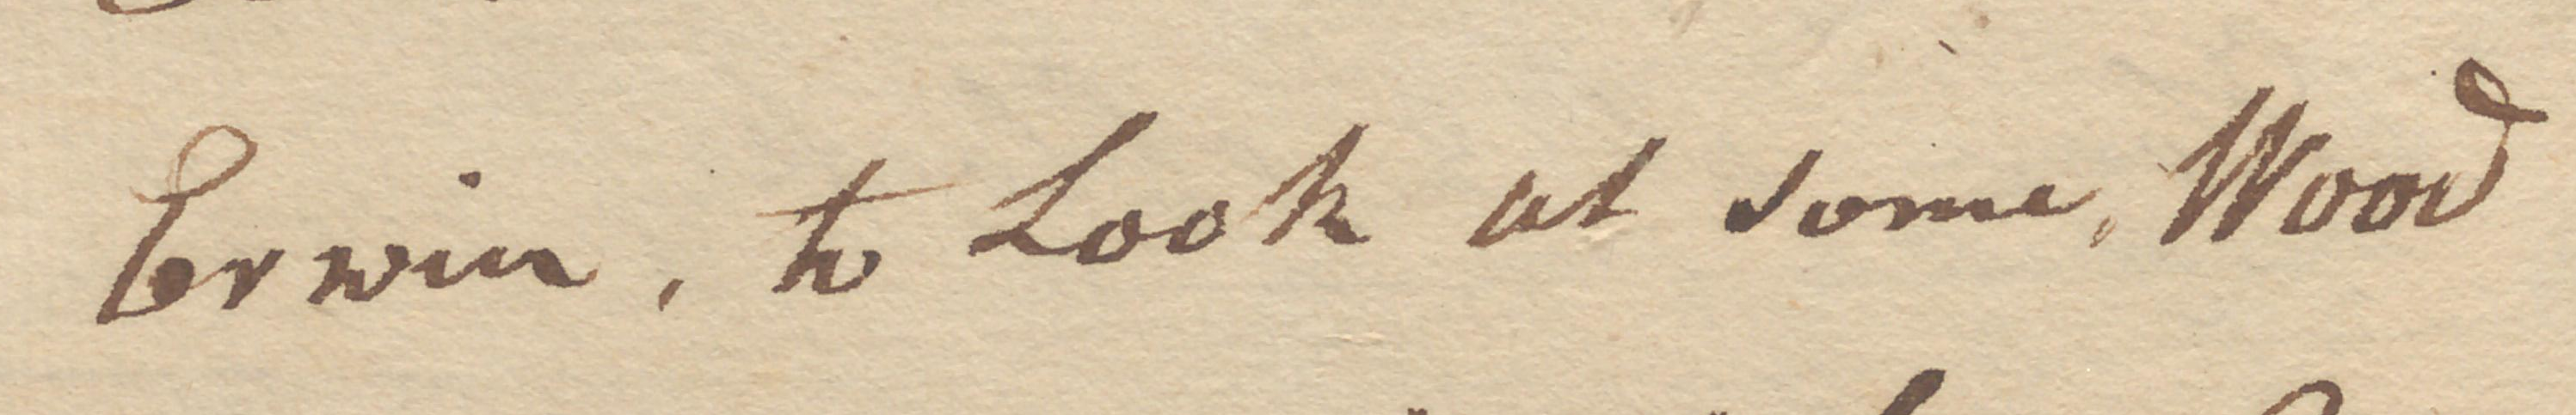Erwin, to Look at some Wood
